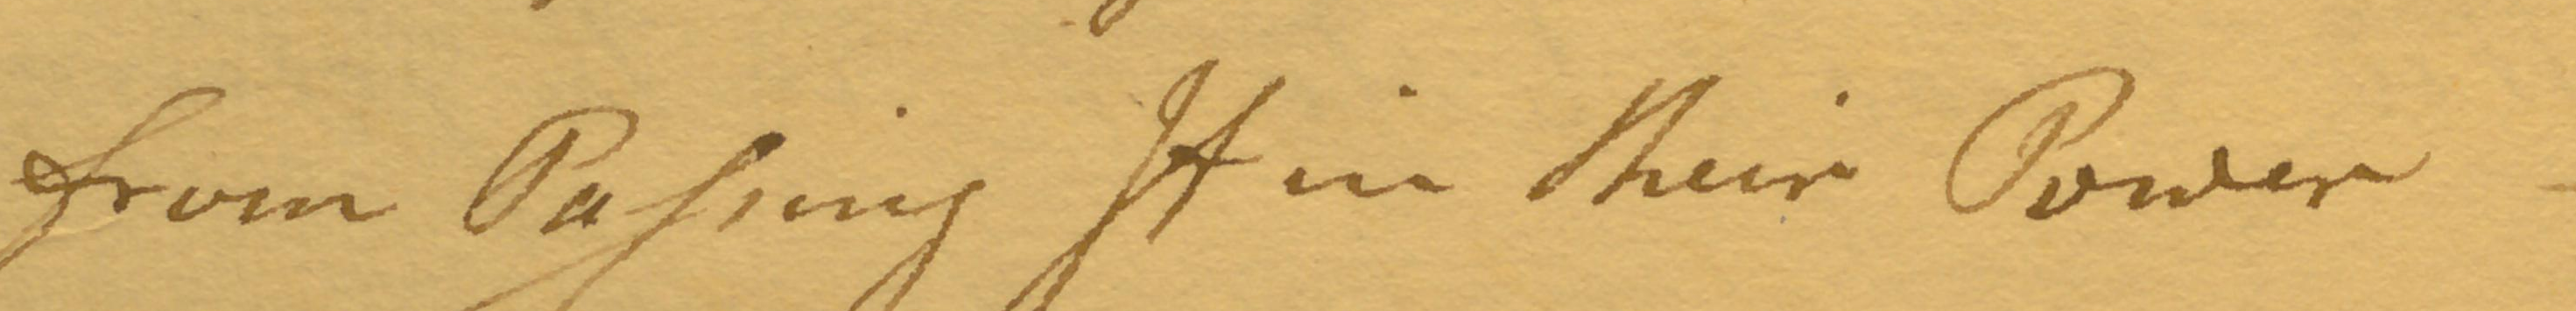from Passing If in their Power
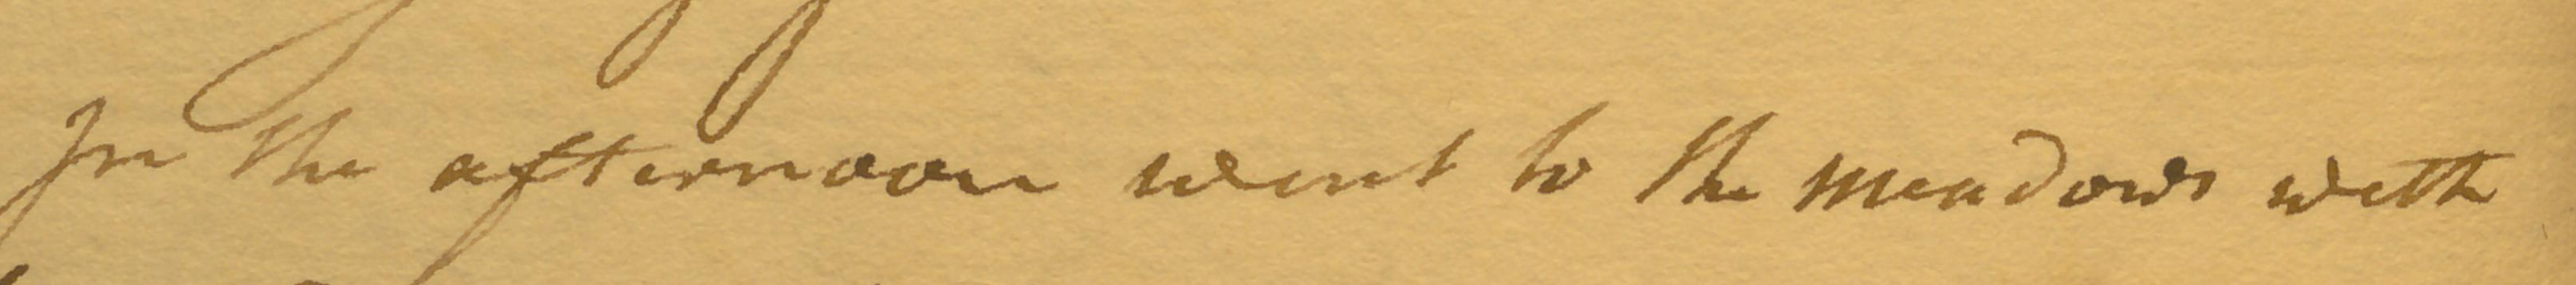In the afternoon went to the meadows with
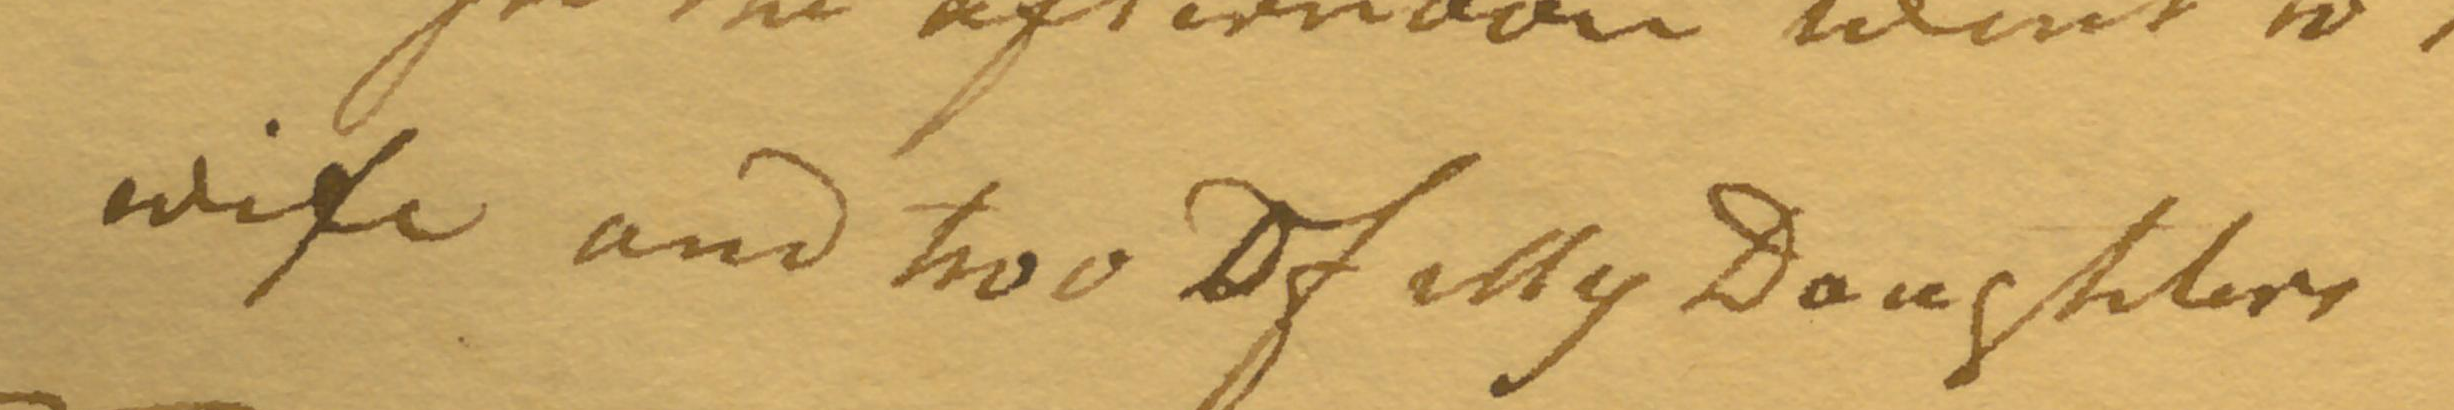wife and two of My Daughters
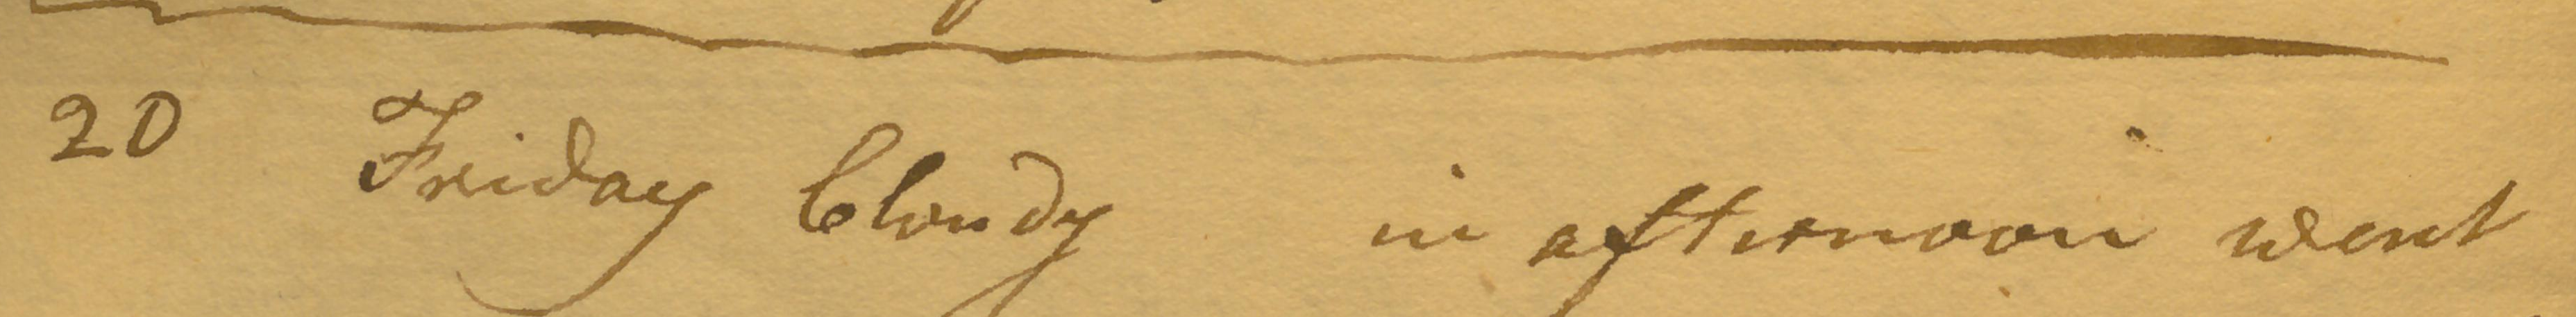20 Friday Cloudy in afternoon went
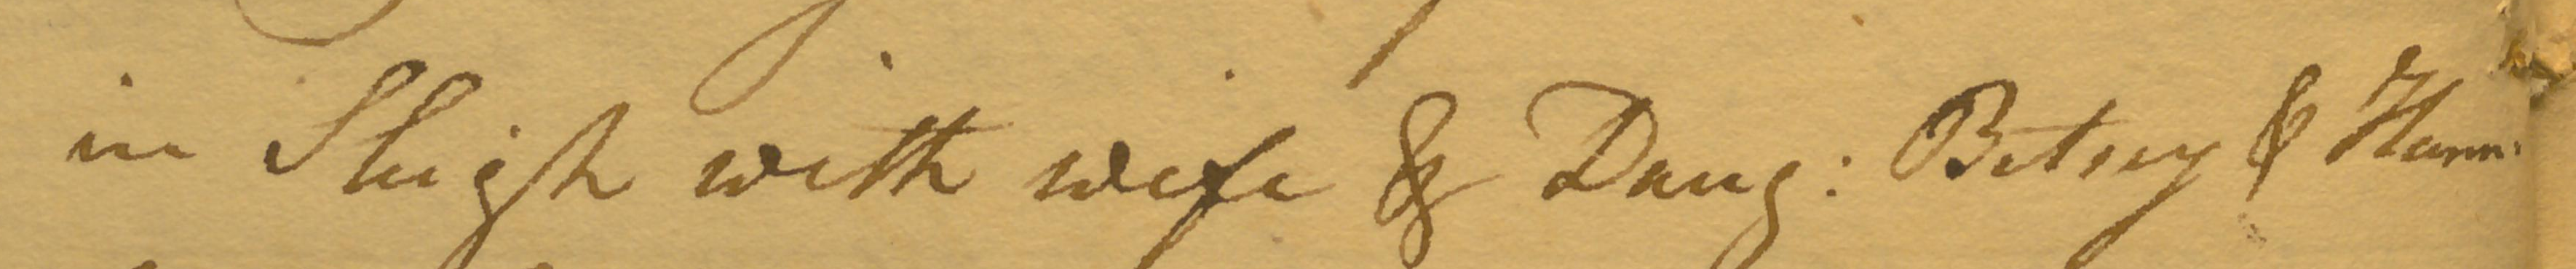in Sleigh with wife & Daug^r. Betsey & Hann
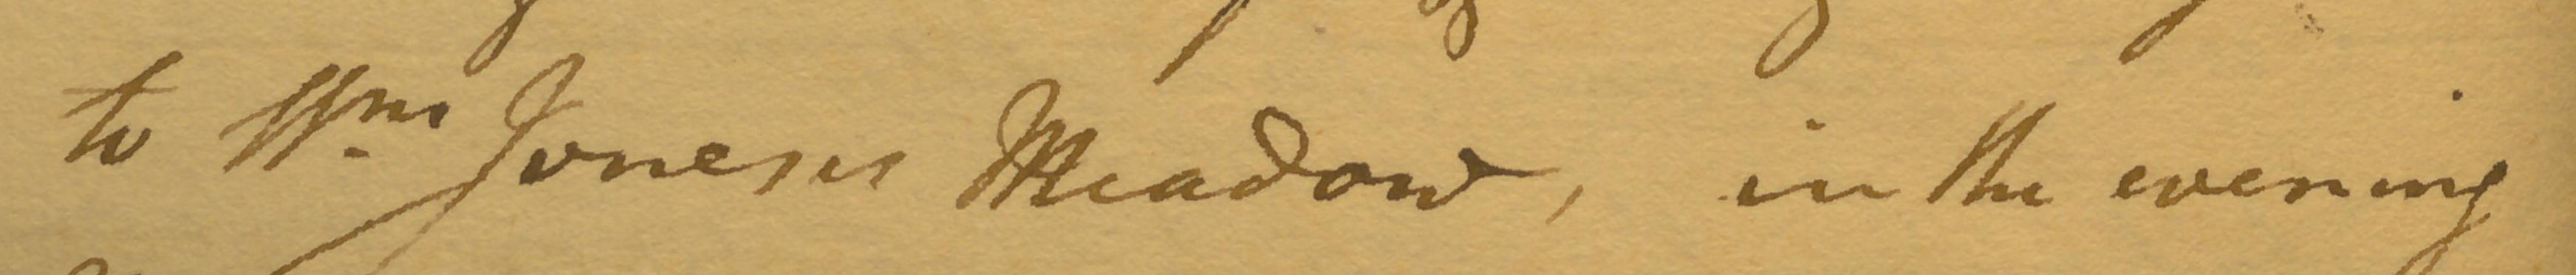to W^m. Joneses Meadow, in the evening
